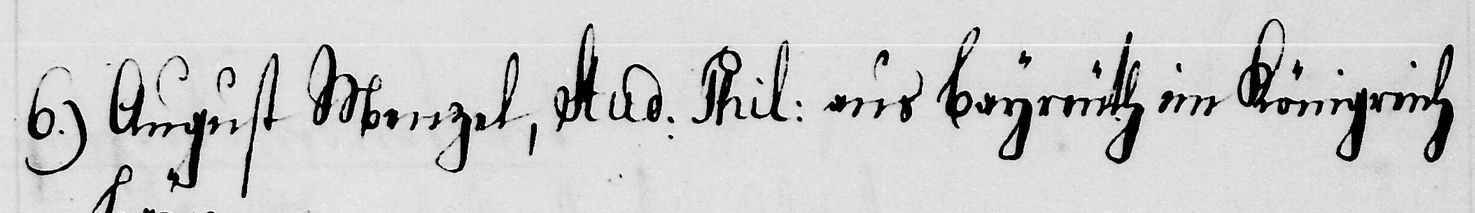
6.) August Menzel, Stud. Phil: aus Bayreuth im Königreich
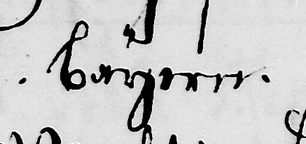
Bayern.
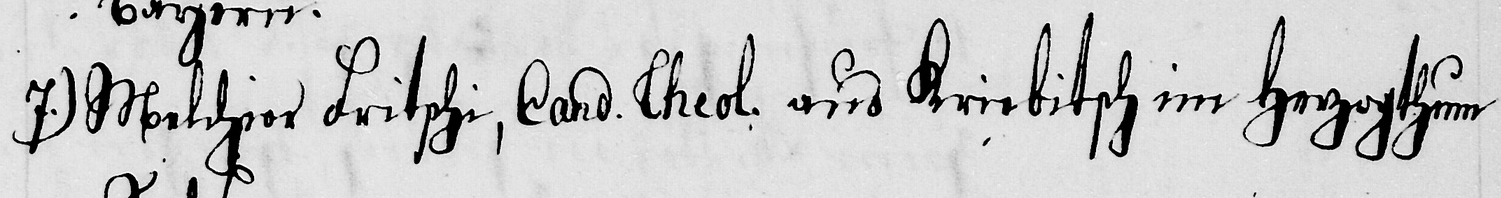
7.) Melchior Fritschi, Cand. Theol. aus Kriebitsch im Herzogthum
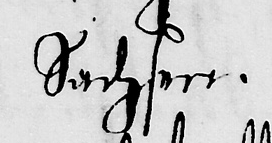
Sachsen.
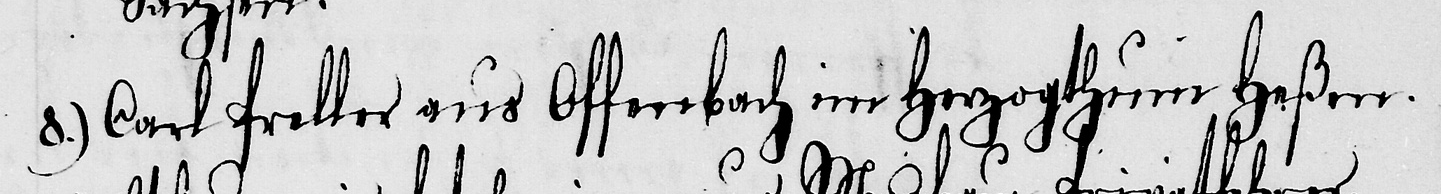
8.) Carl Preller aus Offenbach im Herzogthum Heßen.
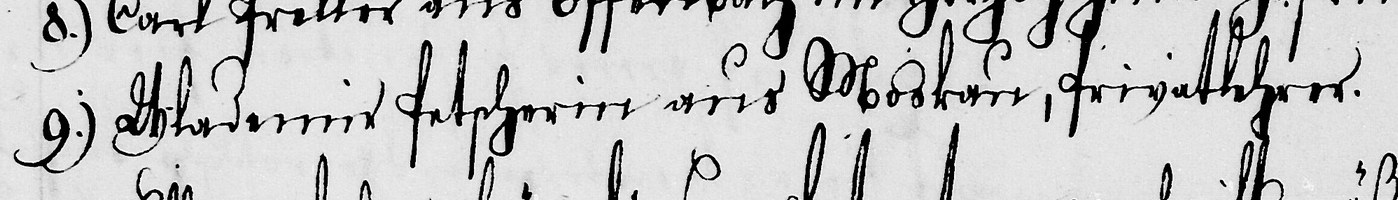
9.) Wlademir Petscherin aus Moskau, Privatlehrer.
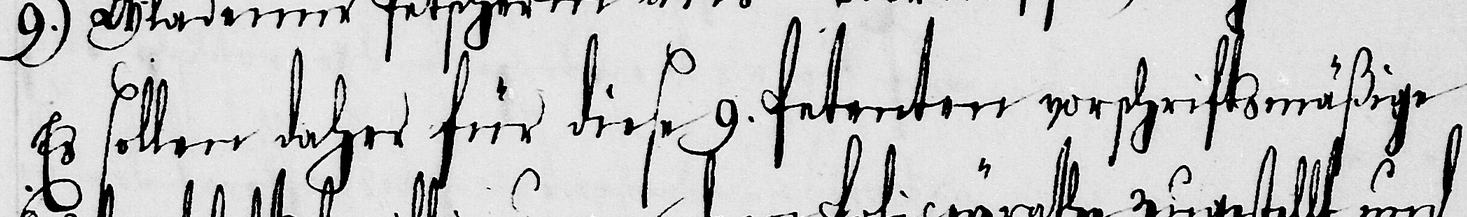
Es sollen daher für diese 9. Petenten vorschriftsmäßige
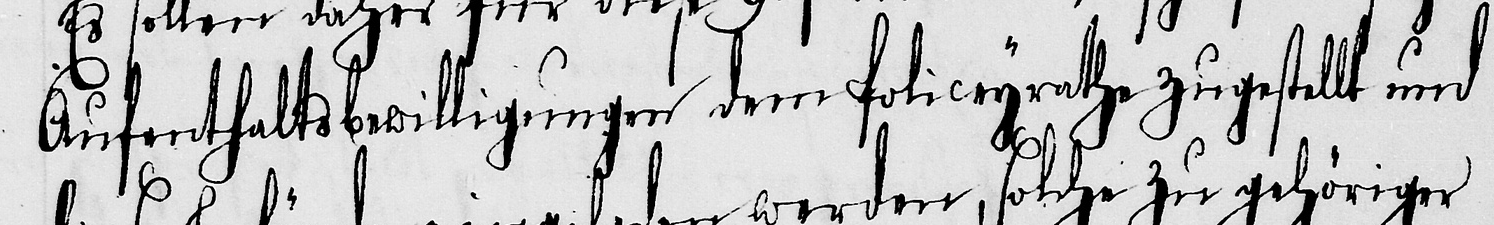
Aufenthaltsbewilligungen dem Policeyrathe zugestellt und
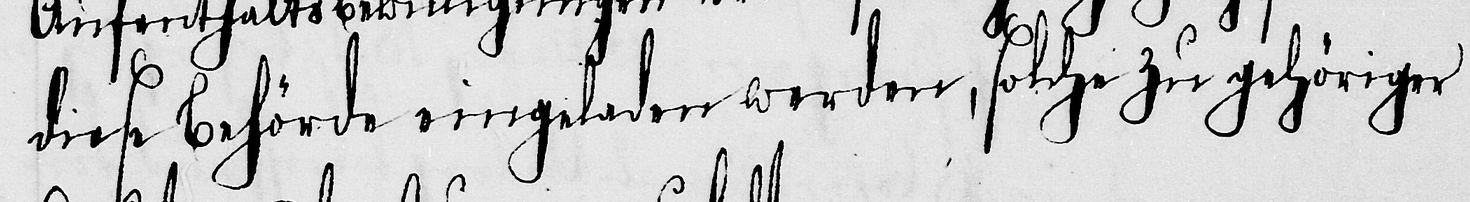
diese Behörde eingeladen werden, solche zu gehöriger
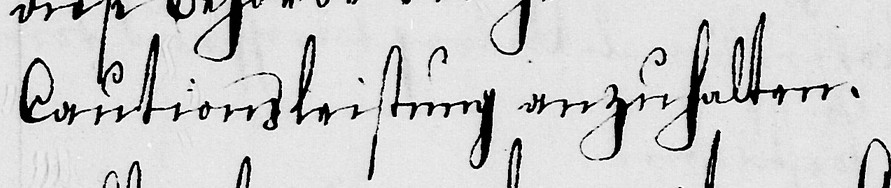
Cautionsleistung anzuhalten.
